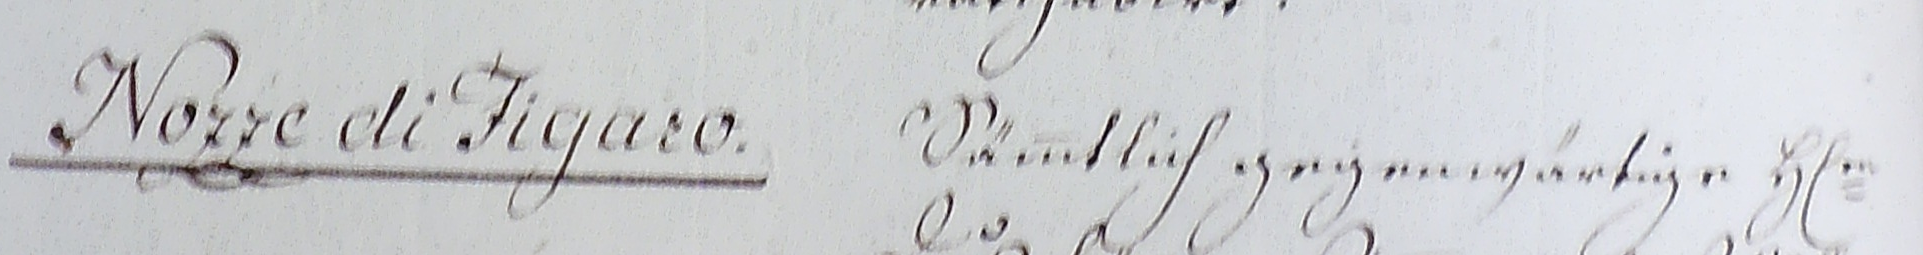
Nozze di Figuro. Säm̅tlich gegenwärtige HEr͇n
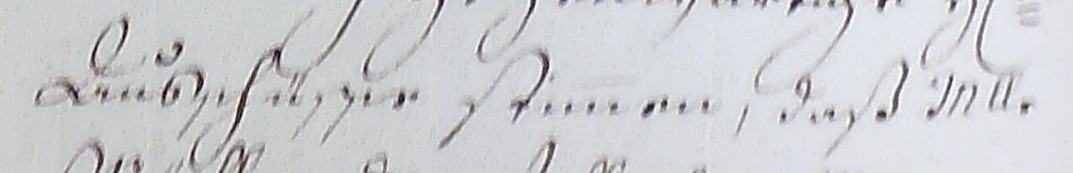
Ausschüsse stim̅en, daß Mlle.
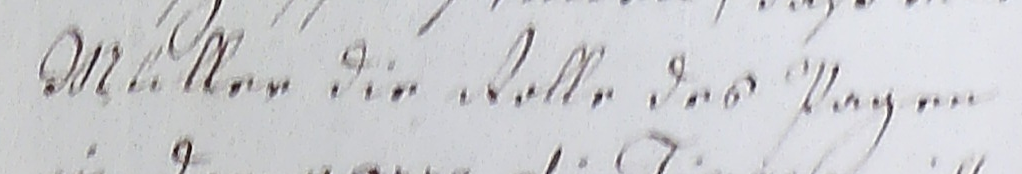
Müller die Rolle des Pagen
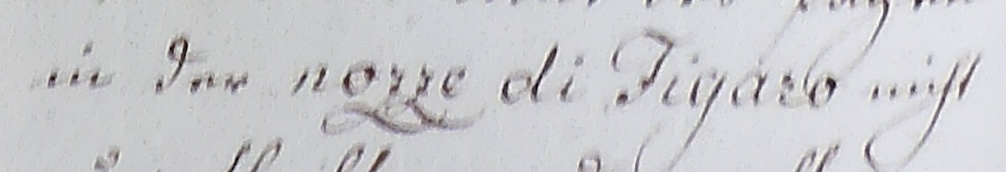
in der nozze di Figaro nicht
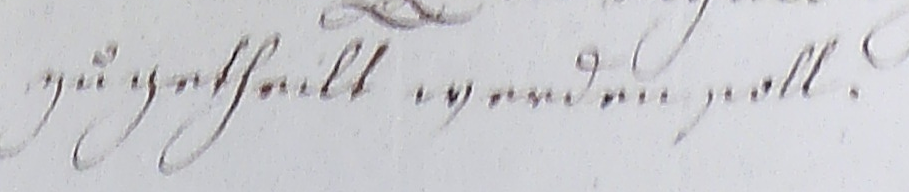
zugetheilt werden soll.
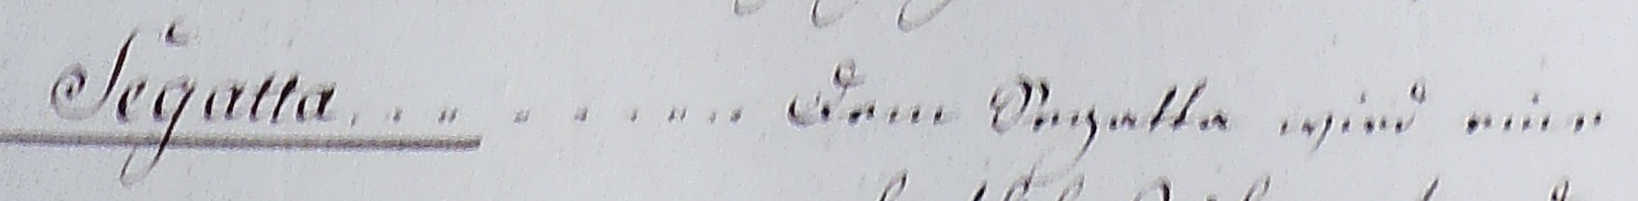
Segatta. . .. .. .. .. Dem Segatta wird eine
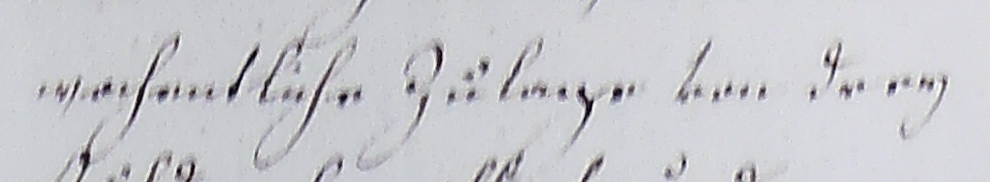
wochentliche Zulage von drey
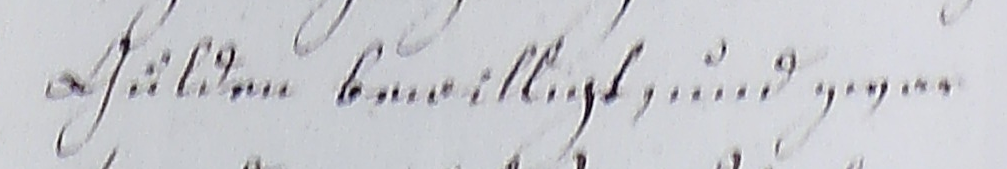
Gulden bewilligt, und zwar
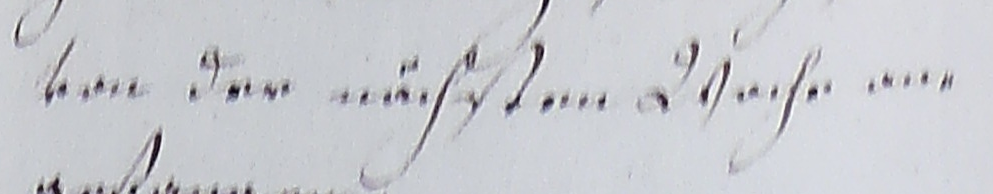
von der nächsten Woche an¬
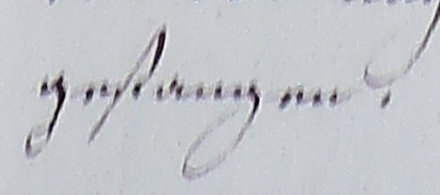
gefangen.
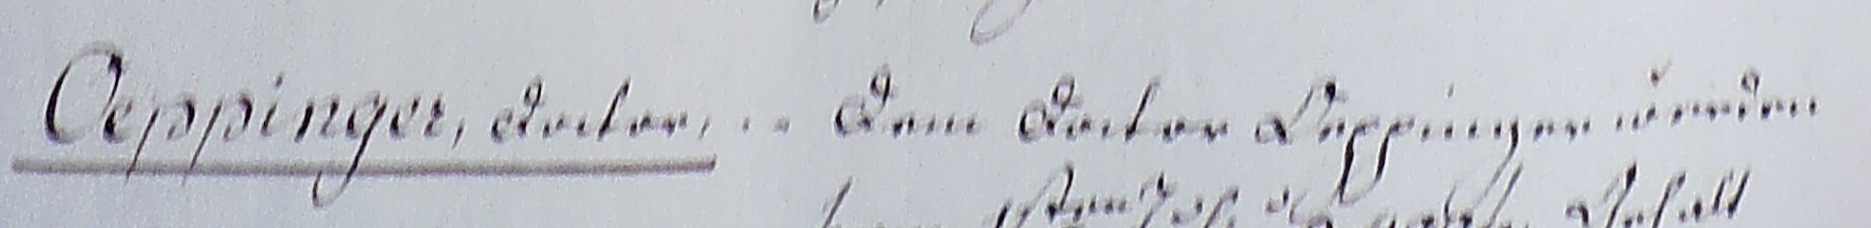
Oeppinger, Doctor, . .. Dem Doctor Oeppinger werden
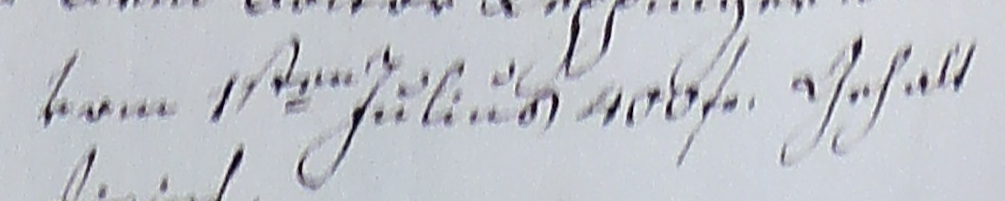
vom 1ste͇n Julius 400fr. Gehalt
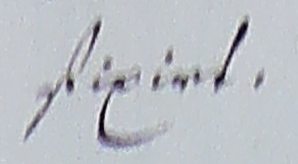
fixirt.
